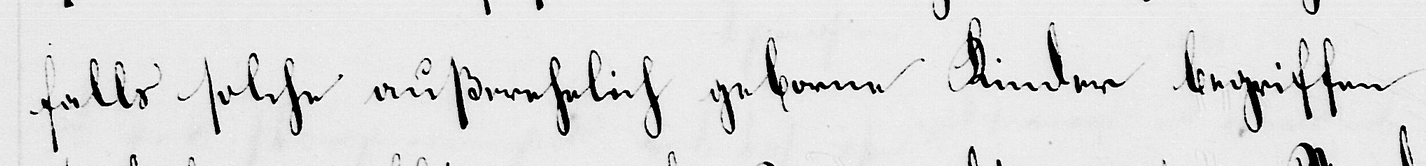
falls solche außerehelich geborne Kinder begriffen
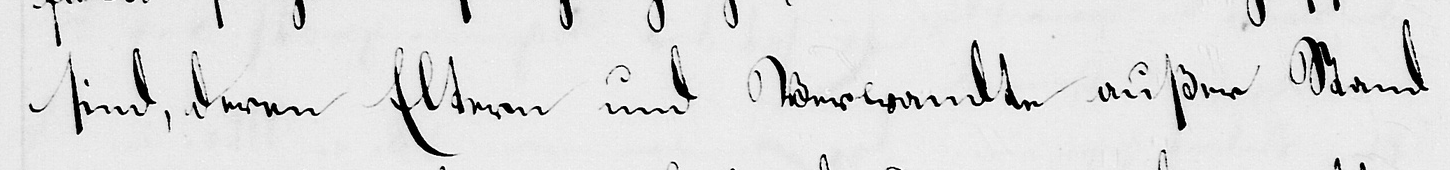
sind, deren Eltern und Verwandte außer Stand
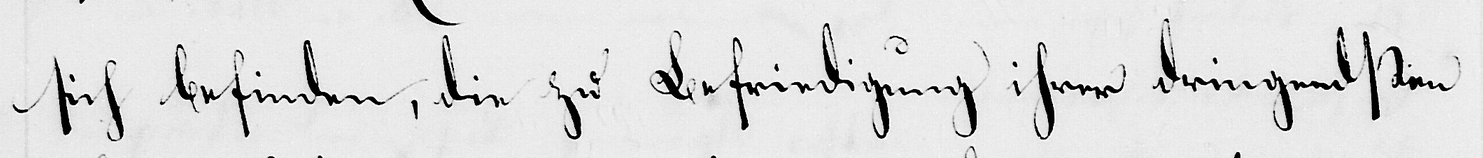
sich befinden, die zu Befriedigung ihrer dringendsten
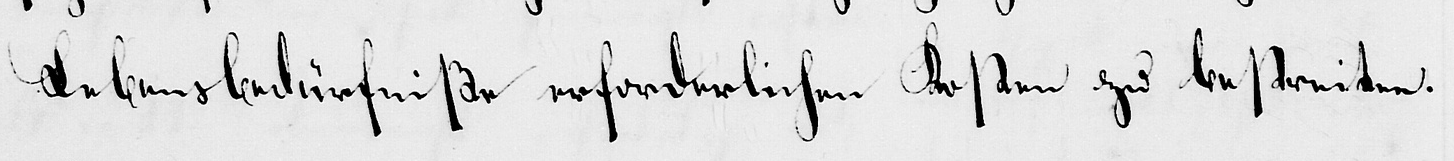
Lebensbedürfniße erforderlichen Kosten zu bestreiten.
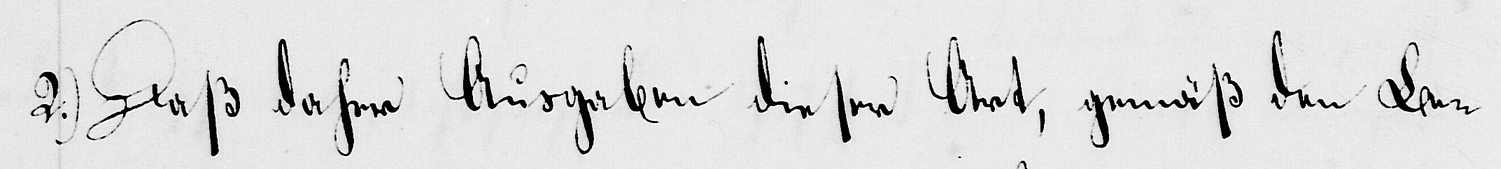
2.) Daß daher Ausgaben dieser Art, gemäß den Be¬
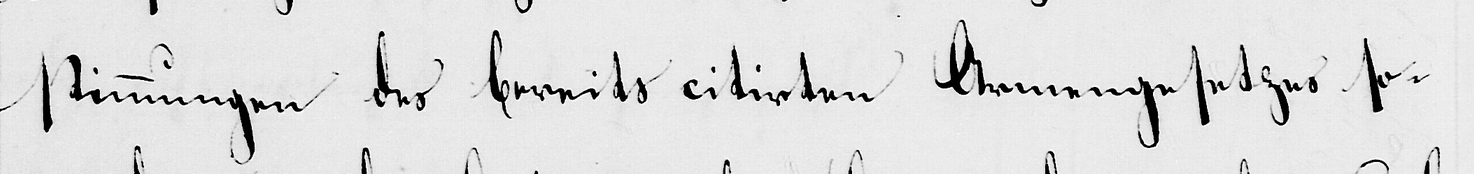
stimmungen des bereits citirten Armengesetzes so¬
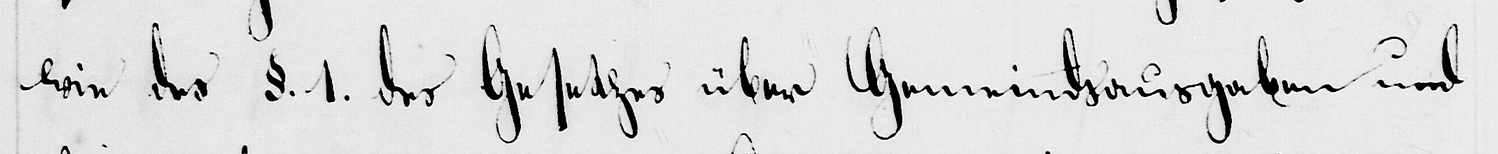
wie des §. 1. des Gesetzes über Gemeindsausgaben und
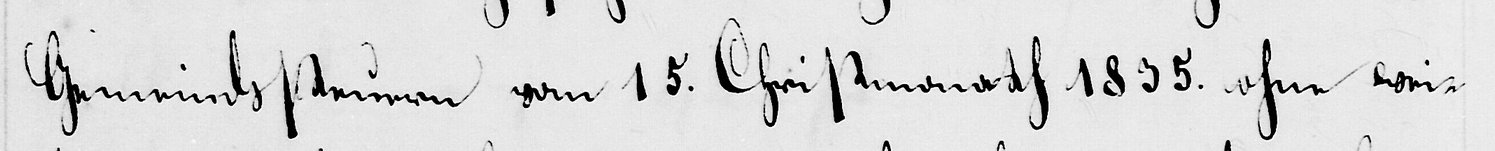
Gemeindssteuern vom 15. Christmonath 1835. ohne wei¬
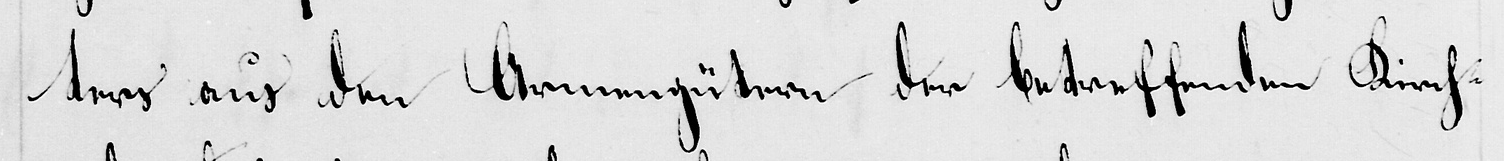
ters aus den Armengütern der betreffenden Kirch-
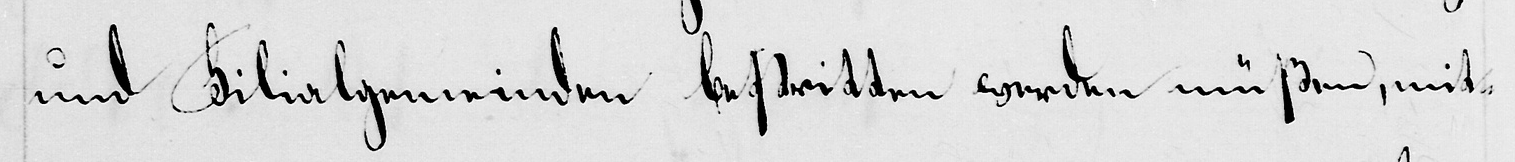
und Filialgmeinden bestritten werden müßen, mit-
